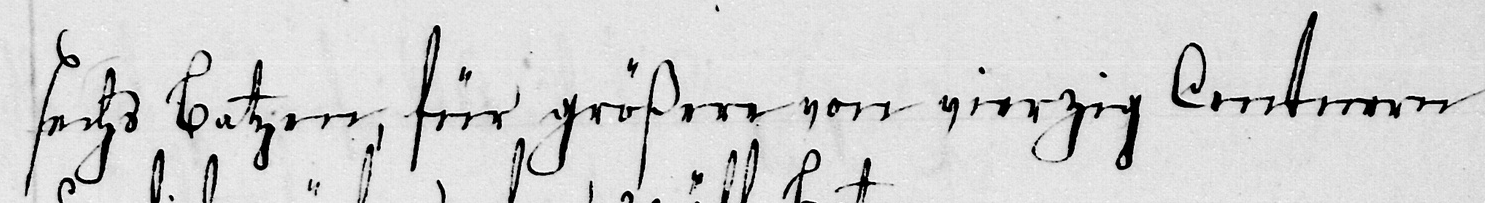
sechs Batzen, für größere von vierzig Centnern
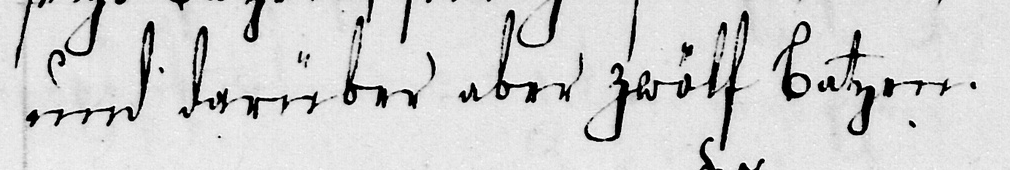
und darüber aber zwölf Batzen.
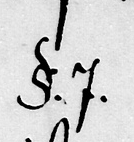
7.
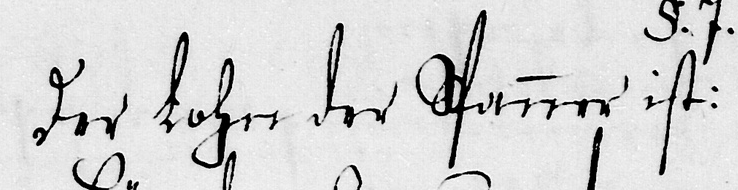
Der Lohn der Spanner ist:
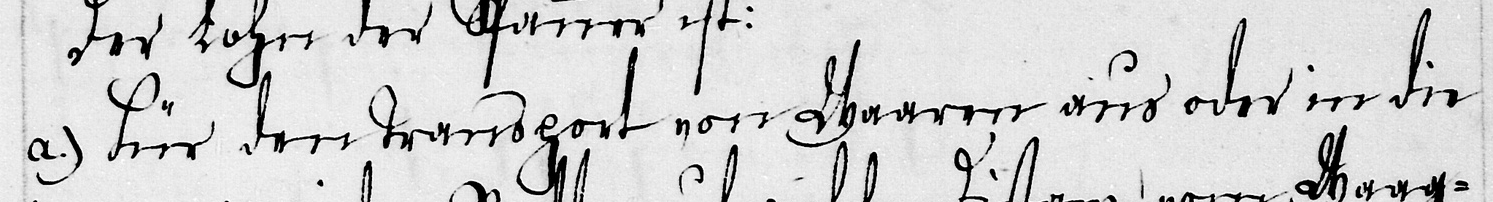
a.) Für den Transport von Waaren aus oder in die
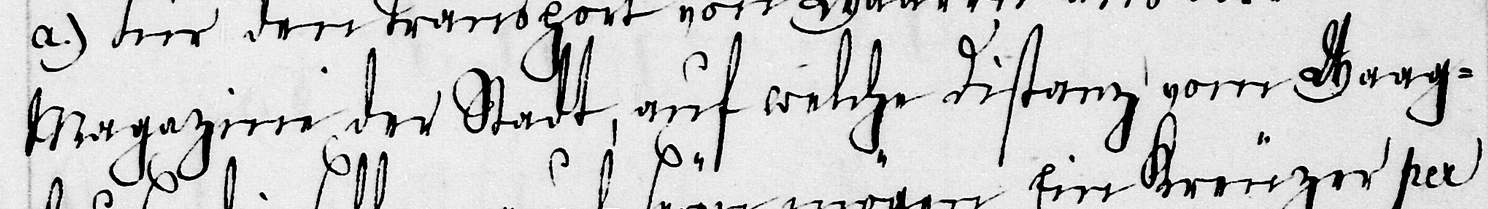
Magazine der Stadt, auf welche Distanz vom Waag¬
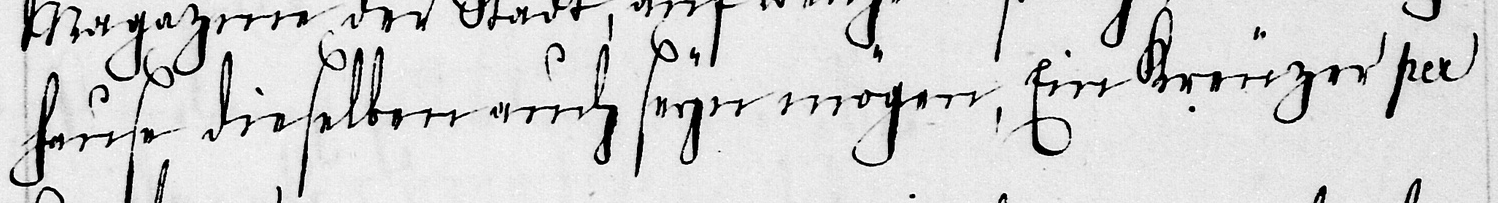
hause dieselben auch seyn mögen, Ein Kreuzer per
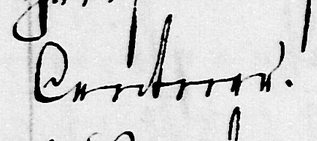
Centner.
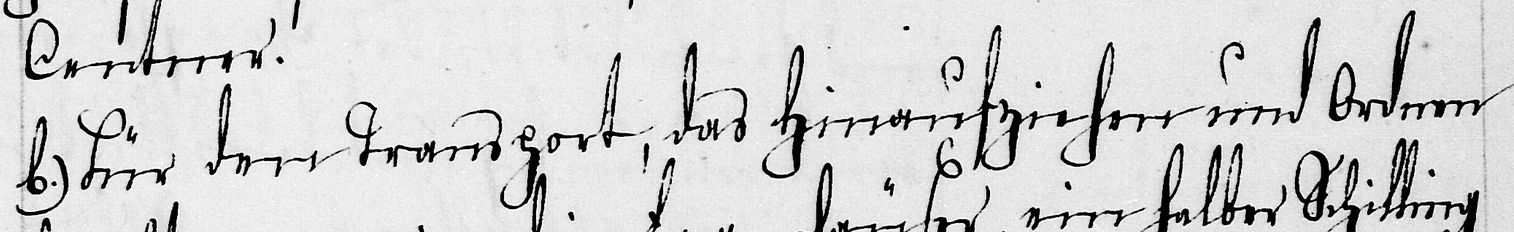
b.) Für den Transport, das Hinaufziehen und Ordnen
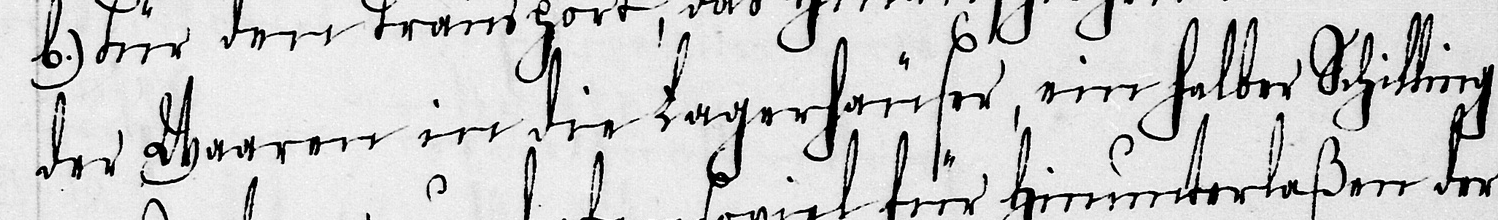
der Waaren in die Lagerhäuser, ein halber Schilling
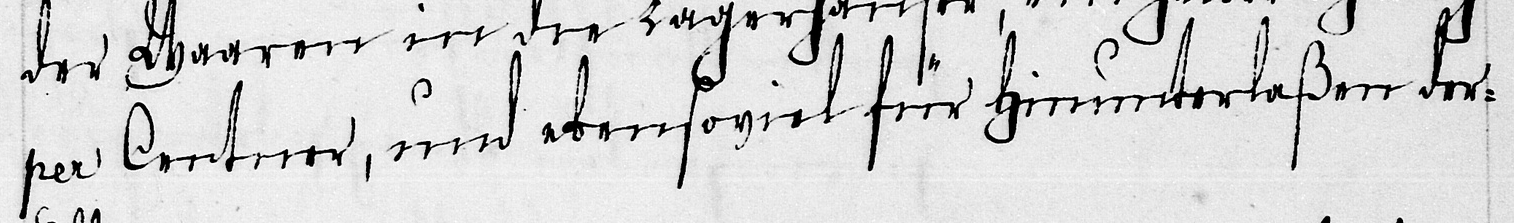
per Centner, und ebensoviel für Hinunterlaßen der¬
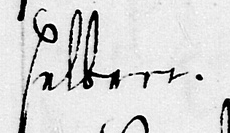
selben.
